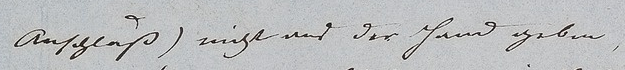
Anschluß) nicht aus der Hand geben,
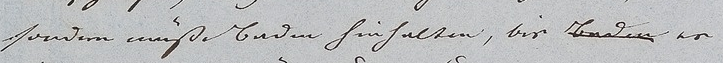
sondern müße Baden hinhalten, bis Baden es
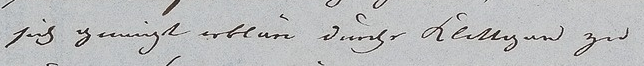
sich geneigt erkläre durchs Klettgau zu
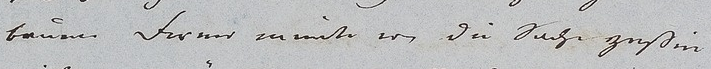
bauen. Ferner meinte er, die Sache pressire
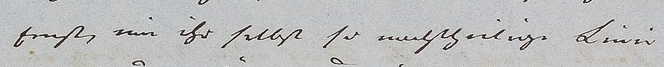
Ernst, eine ihr selbst so nachtheilige Linie
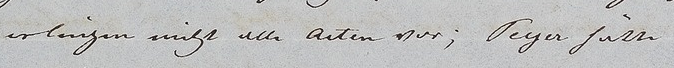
es lägen nicht alle Acten vor; Peyer hätte
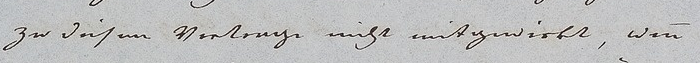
zu diesem Vertrage nicht mitgewirkt, wenn
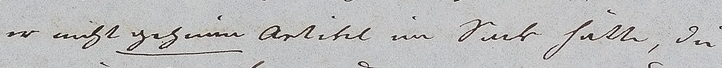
er nicht geheime Artikel im Sack hätte, die
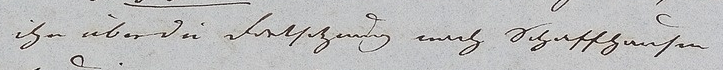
ihn über die Fortsetzung nach Schaffhausen
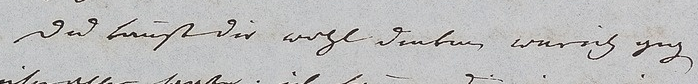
Du kannst dir wohl denken, was ich gegen
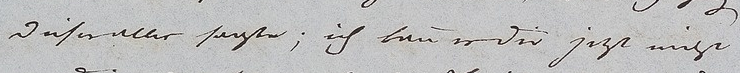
dieses alles sagte; ich kann es dir jetzt nicht
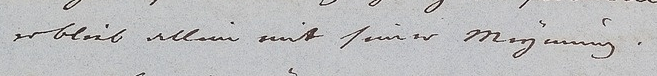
er blieb allein mit seiner Meynung.
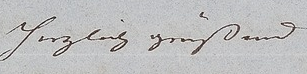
Herzlich grüßend
